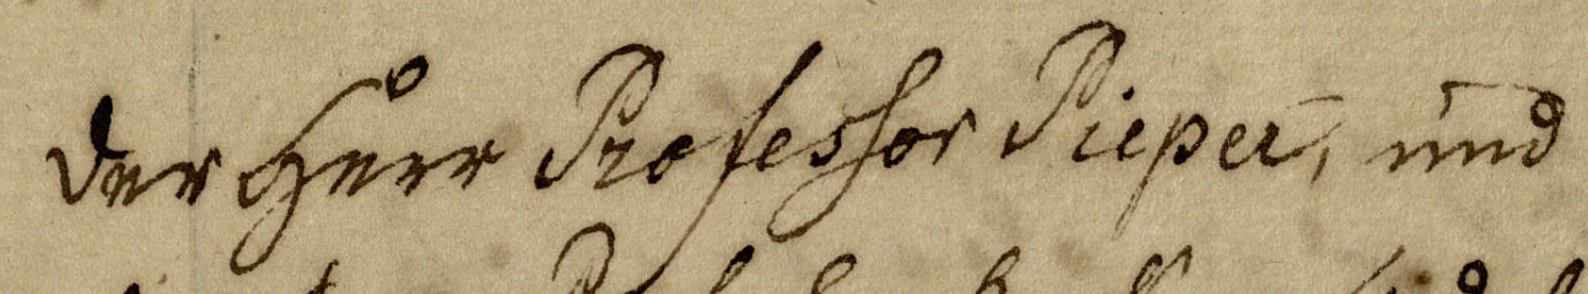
Der Herr Professor Pieper, und
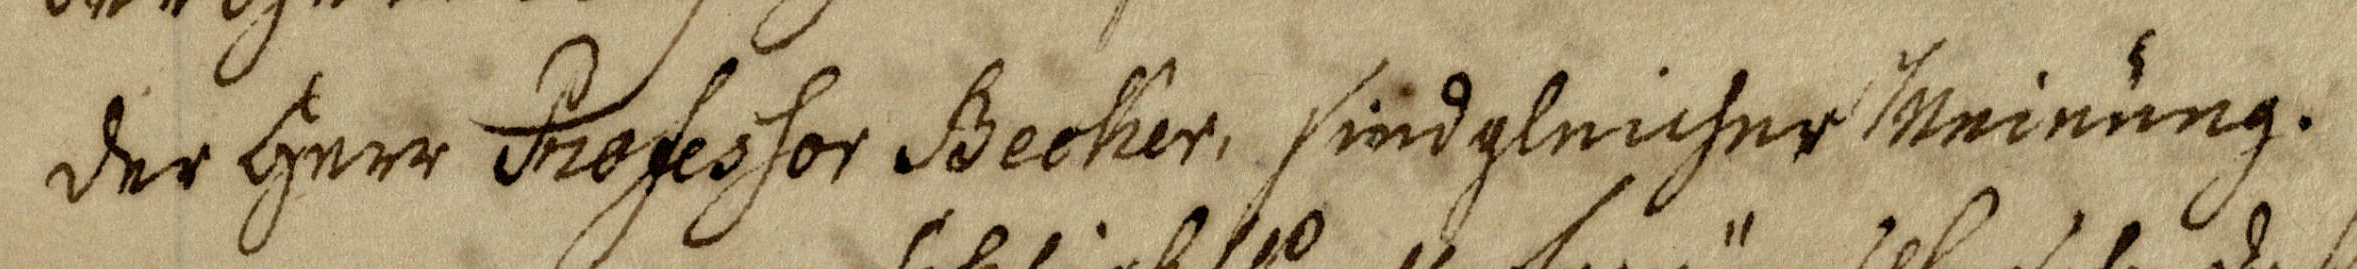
der Herr Professor Becker. sind gleicher Meinung.
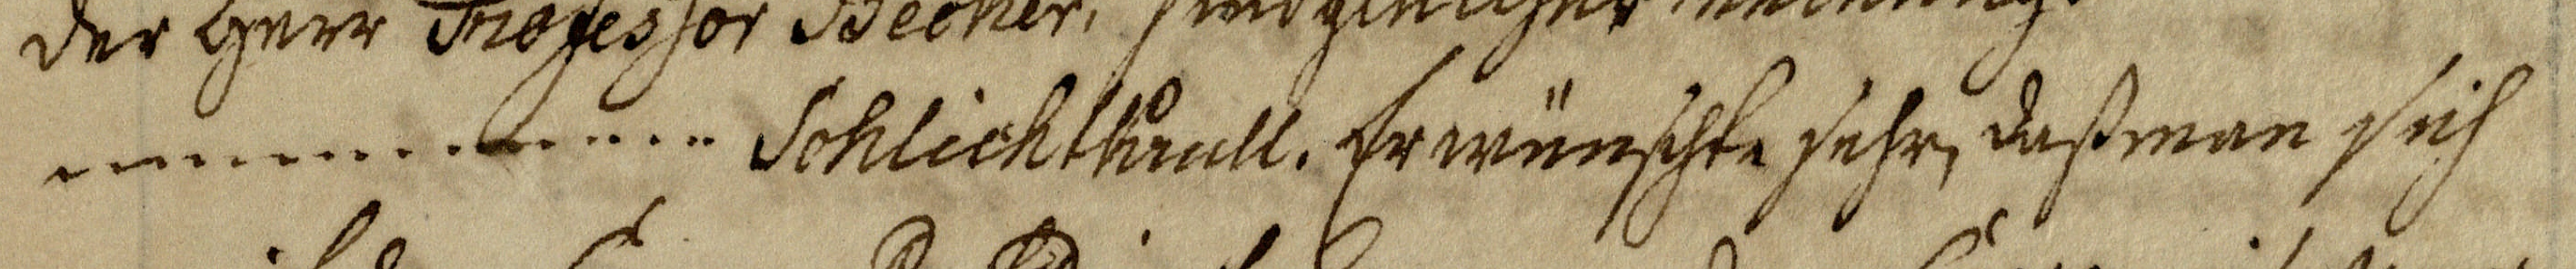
Schlichtkrull. Er wünschte sehr, daß man sich
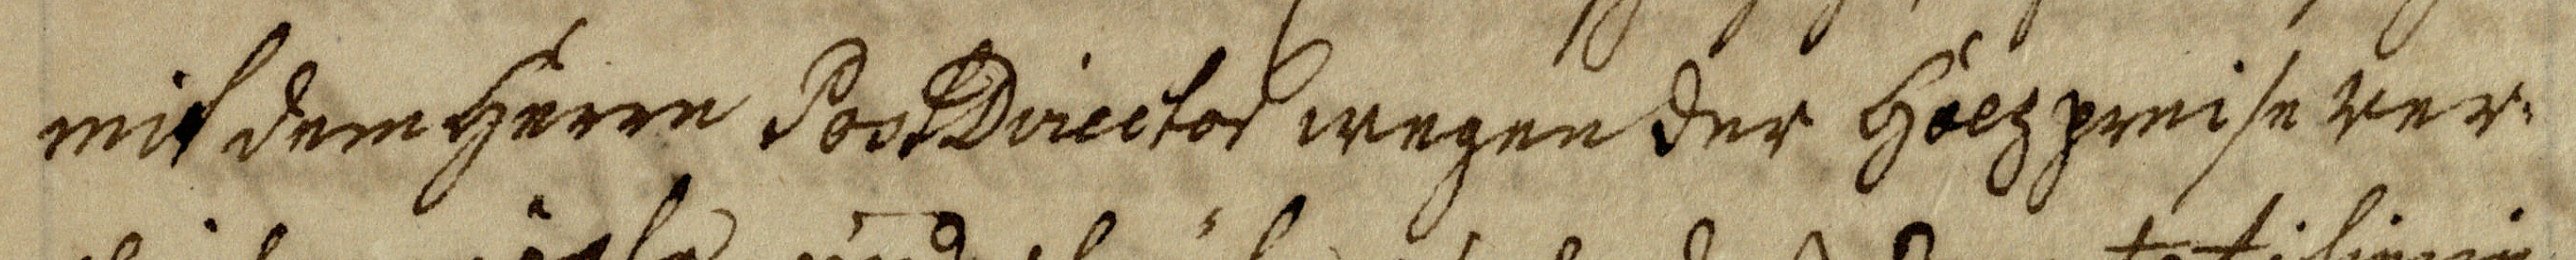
mit dem Herrn Postdirector wegen der Holzpreise ver¬
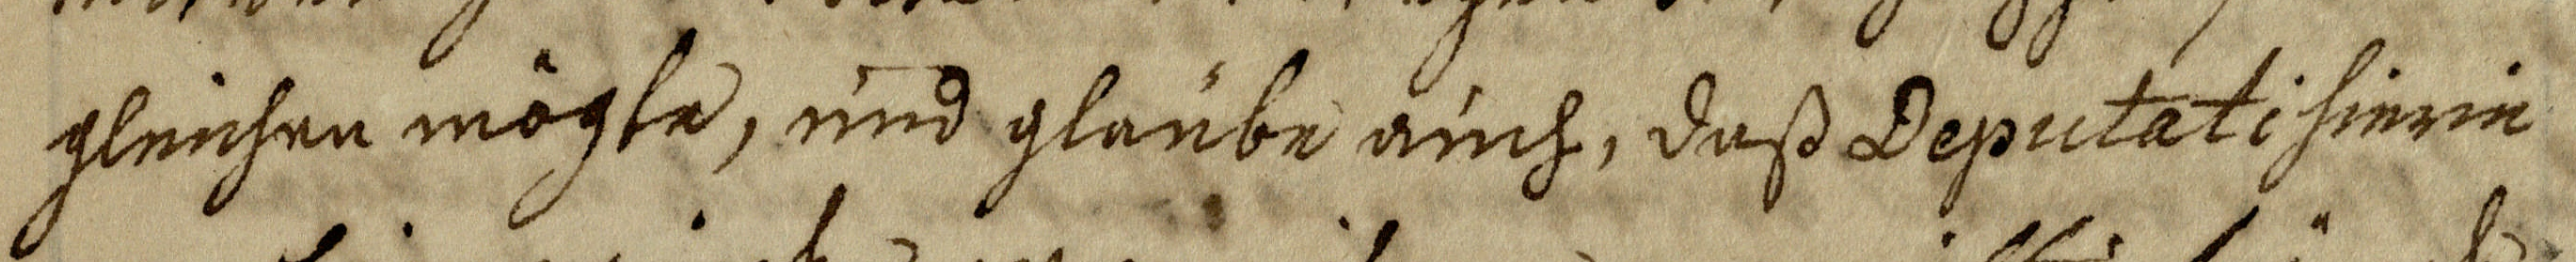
gleichen mögte, und glaube auch, daß Deputati hierin
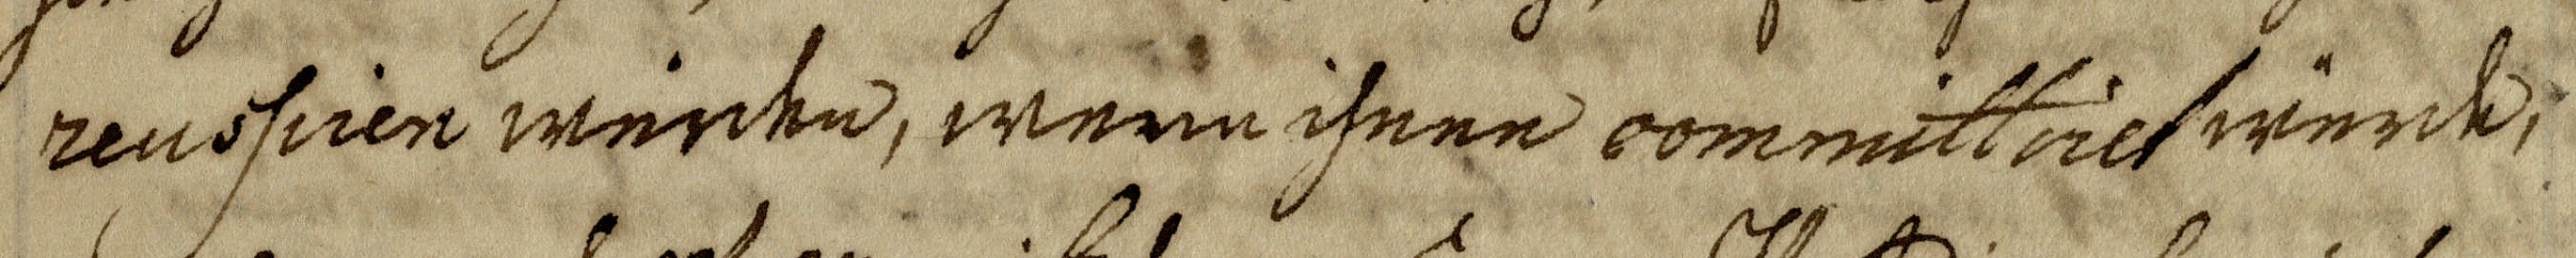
reussiren werden, wenn ihnen committiret würde,
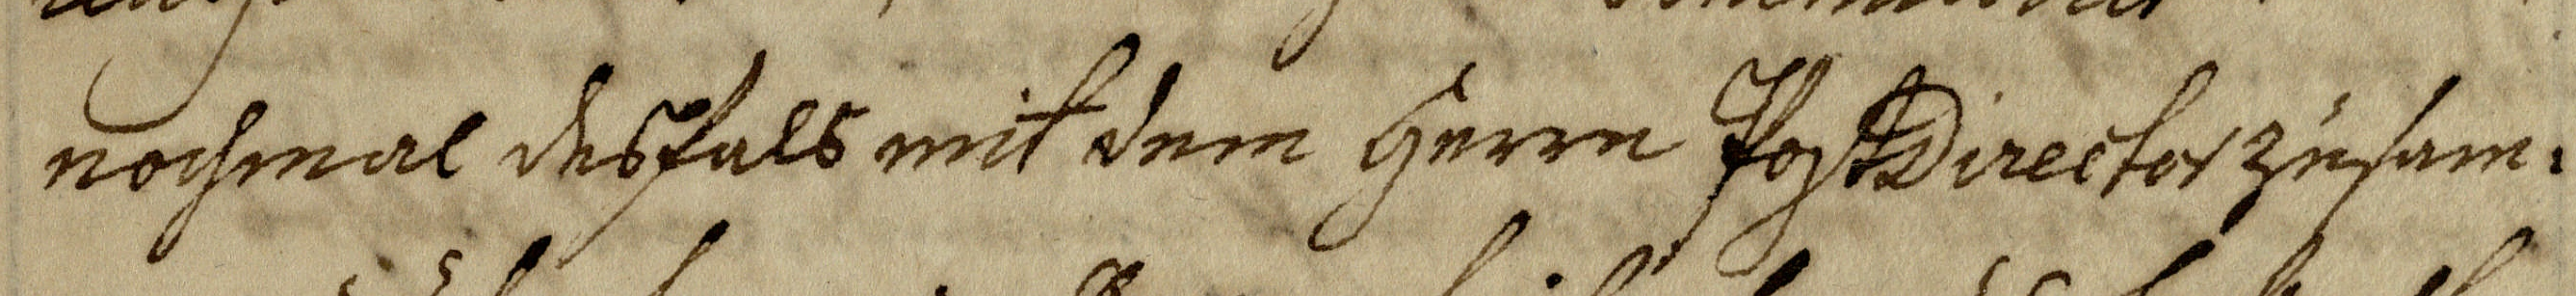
nochmal desfals mit dem Herrn Postdirector zusam¬
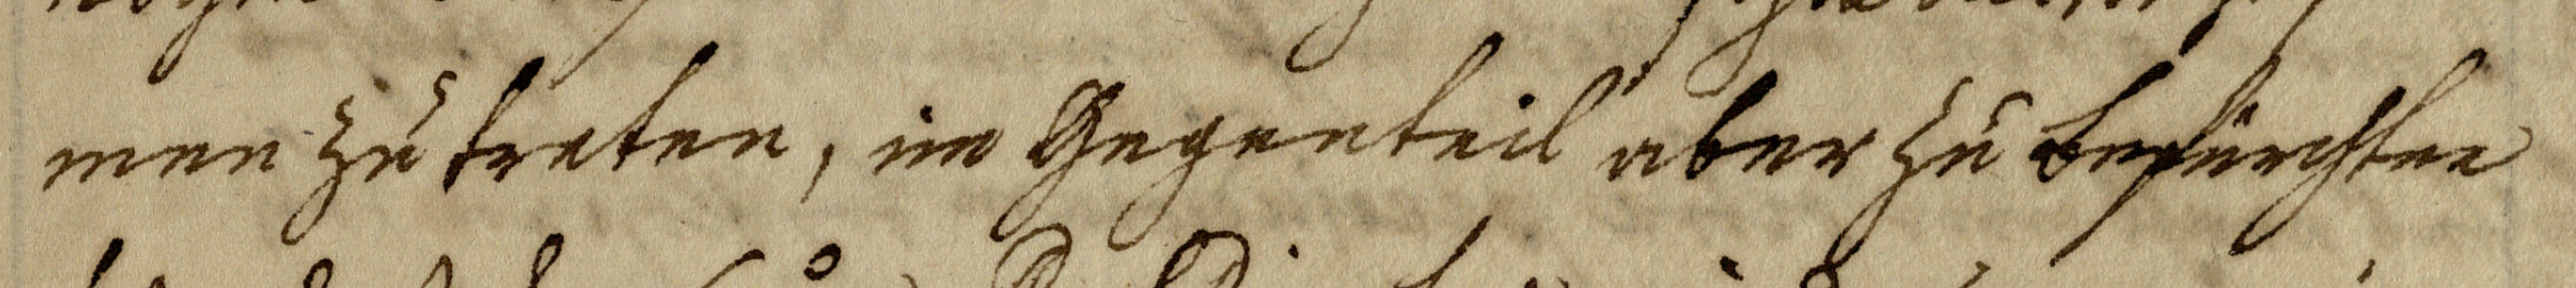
men zu treten, im Gegenteil aber zu befürchten
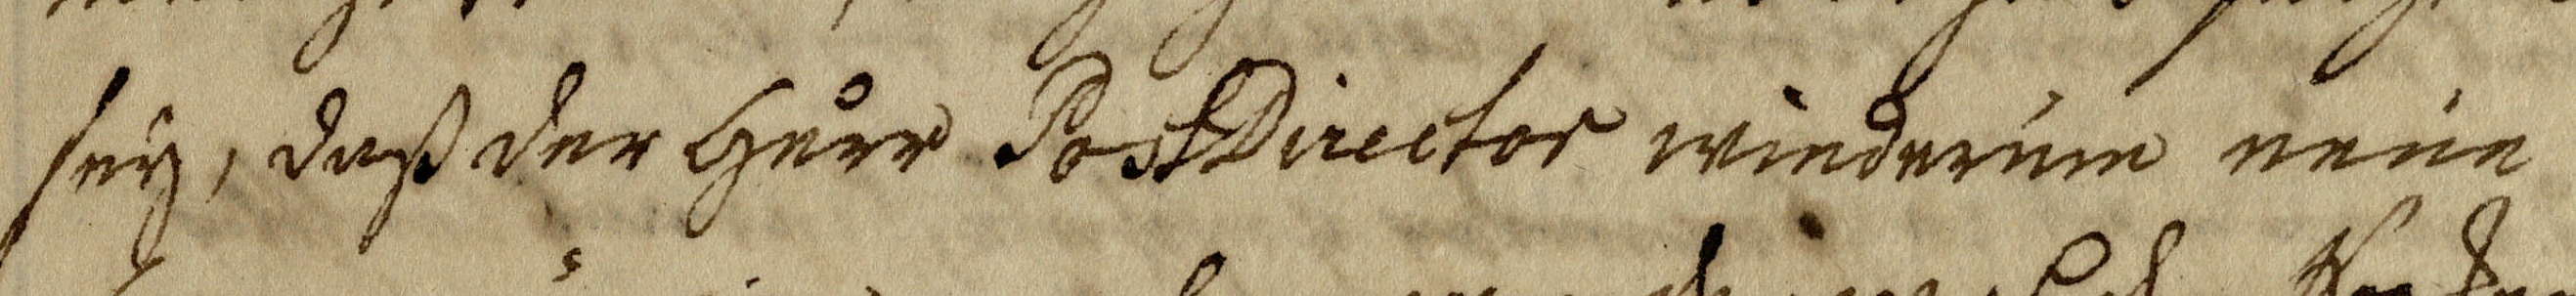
seÿ, daß der Herr PostDirector wiederum neue
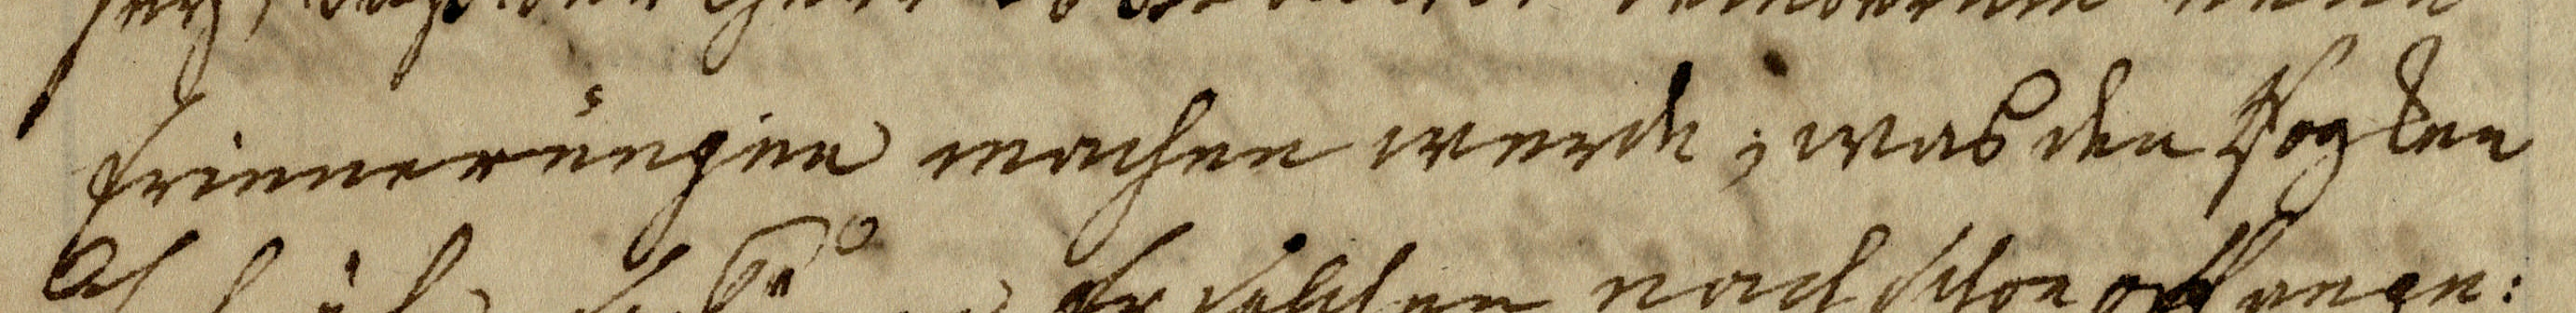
Erinnerungen machen werde; was den Rogken
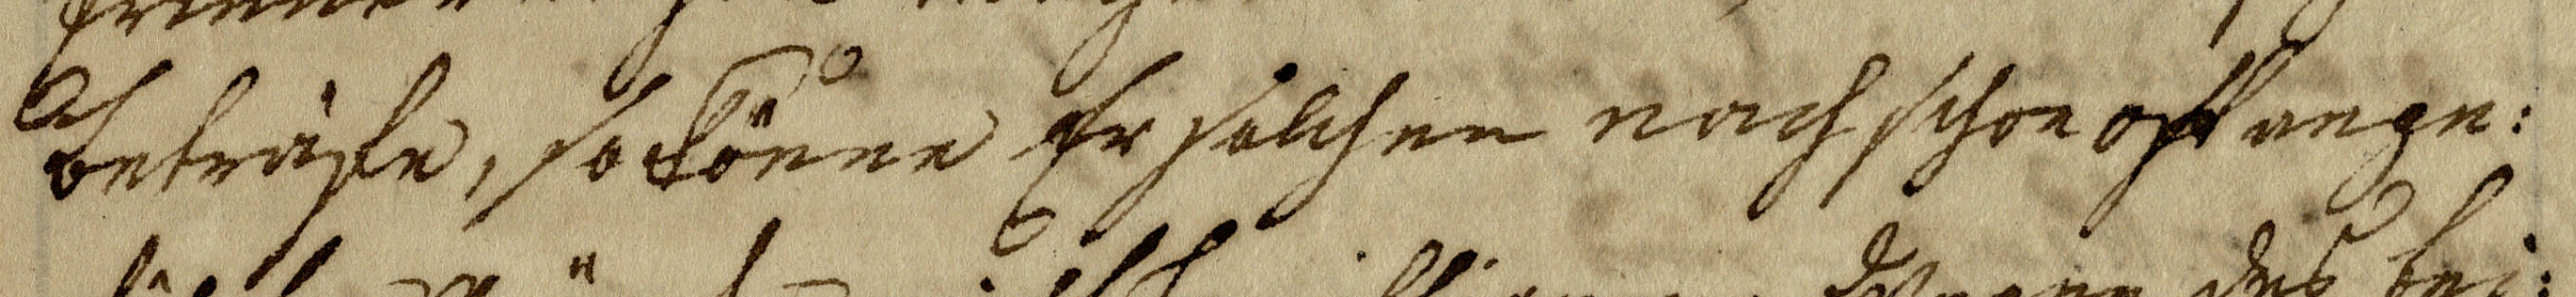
beträfe, so könne Er solchen nach schon oft ange¬
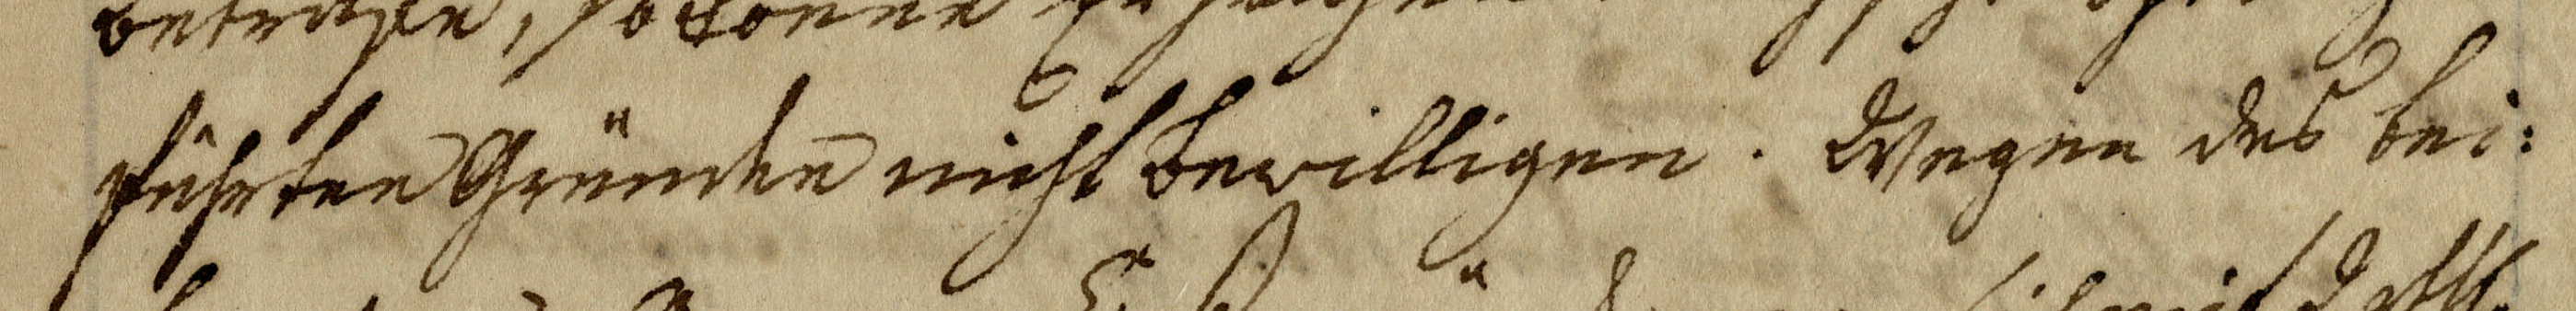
führten Gründen nicht bewilligen. Wegen des Bei¬
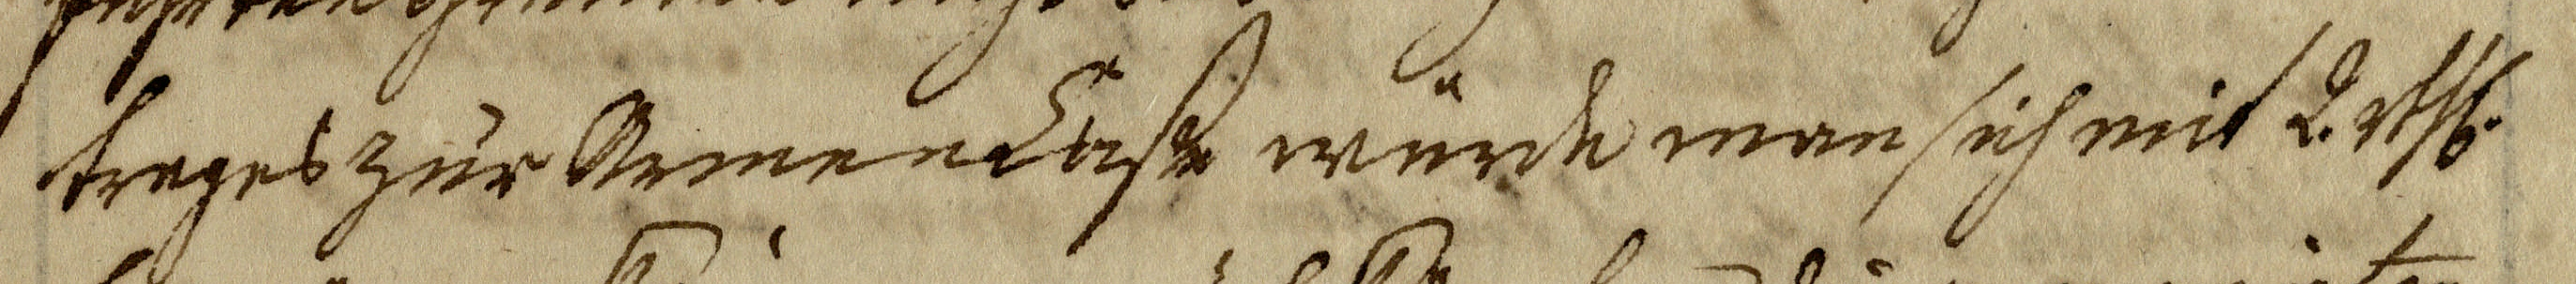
trages zur Armenkaße würde man sich mit 2 rtl.
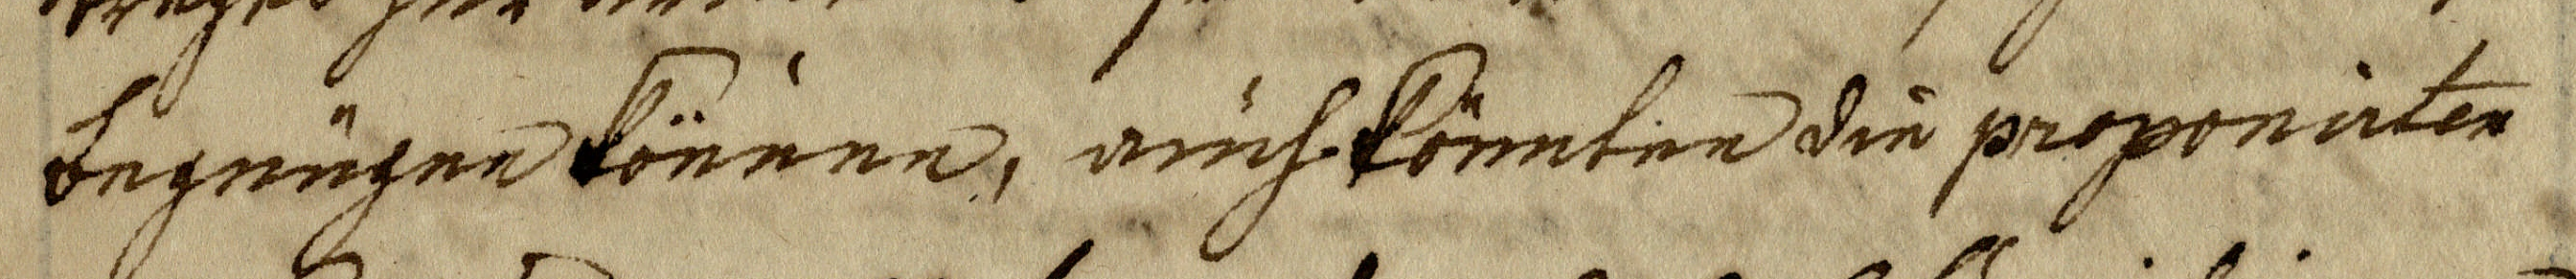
begnügen können, auch könnten die proponirten
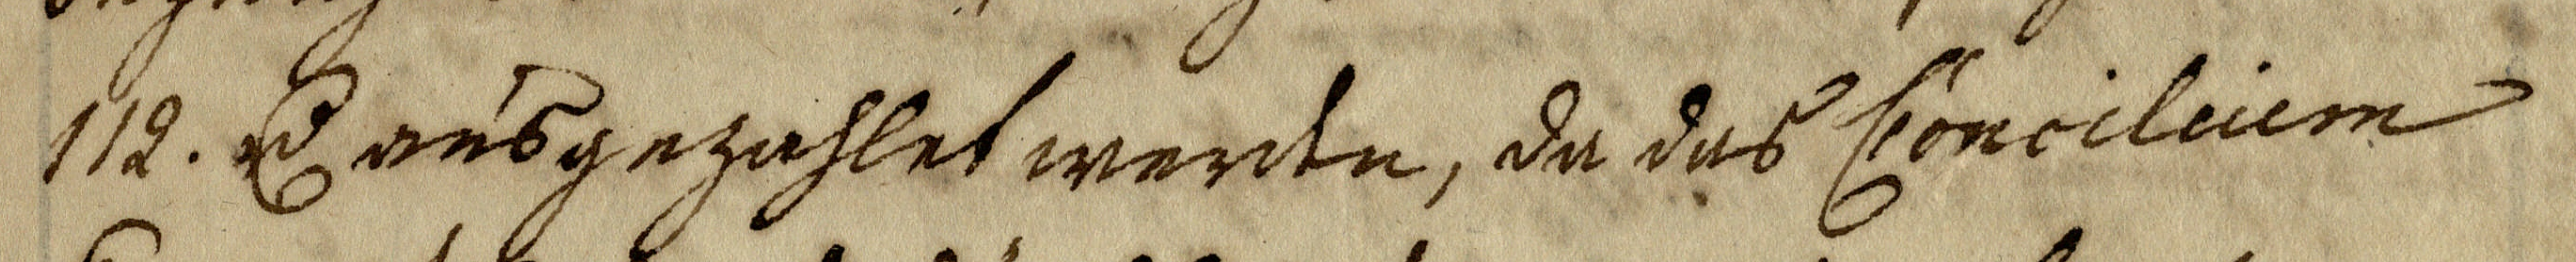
112. r ausgezahlet werden, da das Concilium
